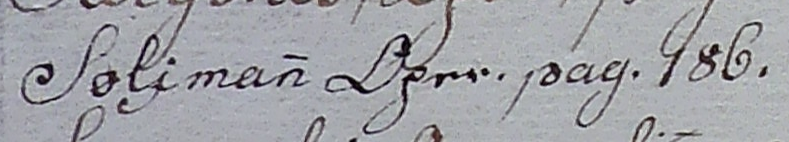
Soliman̅ Oper. pag. 186.
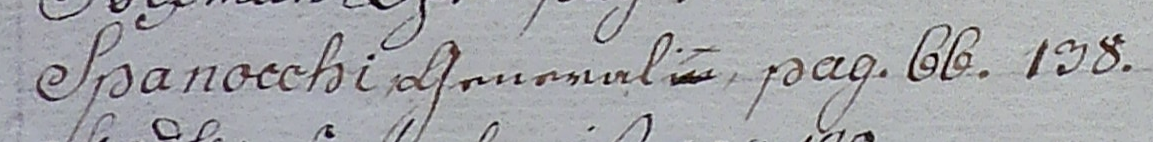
Spanocchi, Generalin̅, pag. 66. 138.
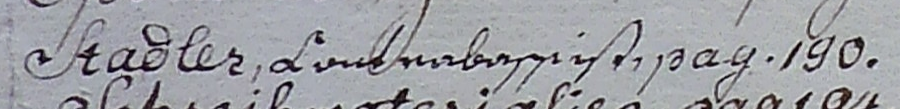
Stadler, Contrabassist, pag. 190.
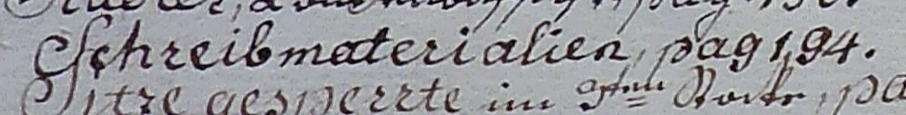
Schreibmaterialien, pag. 194.
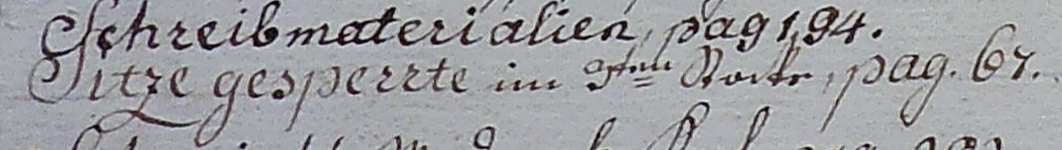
Sitze gesperrte im 3te͇n Stocke, pag. 67.
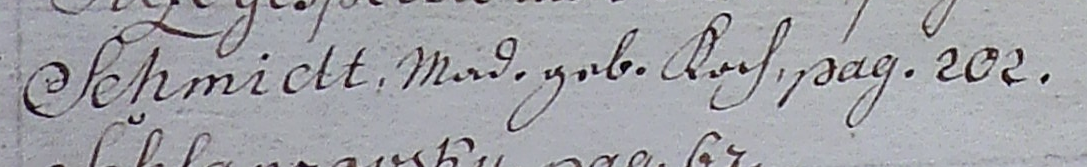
Schmidt, Mad. geb Koch, pag. 202.
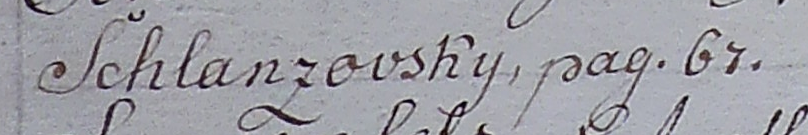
Schlanzovsky, pag. 67.
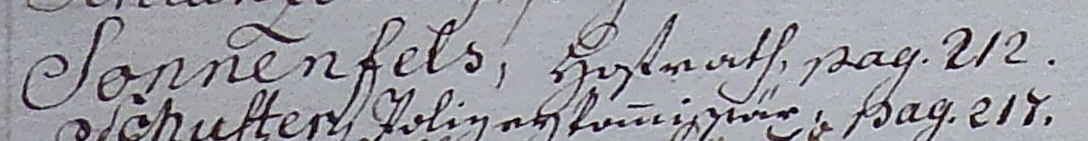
Sonnenfels, Hofrath, pag. 212.
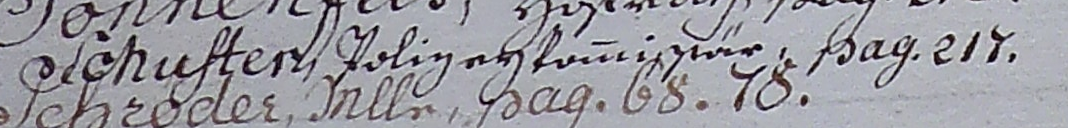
Schuster, Polizeykom̅issär, pag. 217.
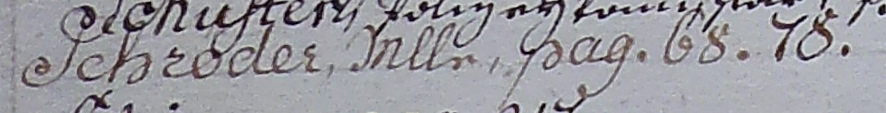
Schröder, Mlle, pag. 68. 78.
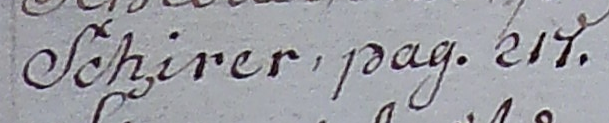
Schirer, pag. 217.
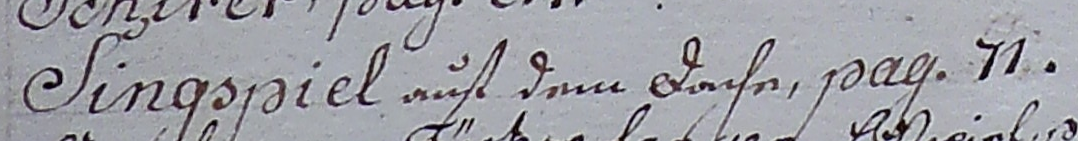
Singspiel auf dem Dache, pag. 71.
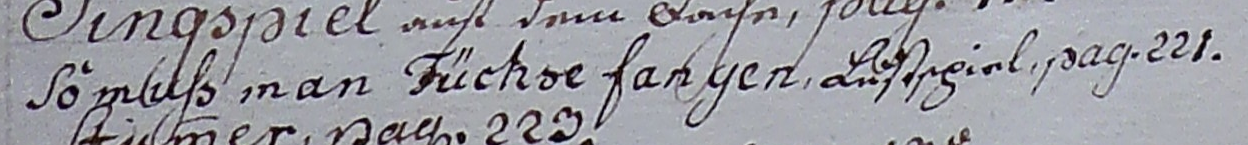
So muss man Füchse fangen, Lustspiel, pag. 221.
